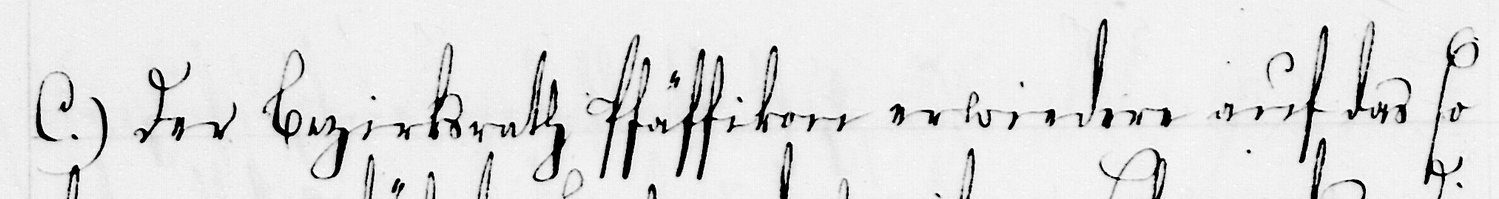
C.) Der Bezirksrath Pfäffikon erwiedere auf das so
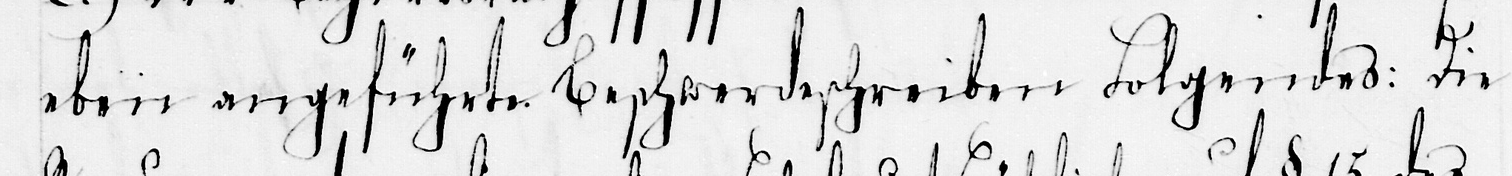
eben angeführte Beschwerdeschreiben Folgendes: Die
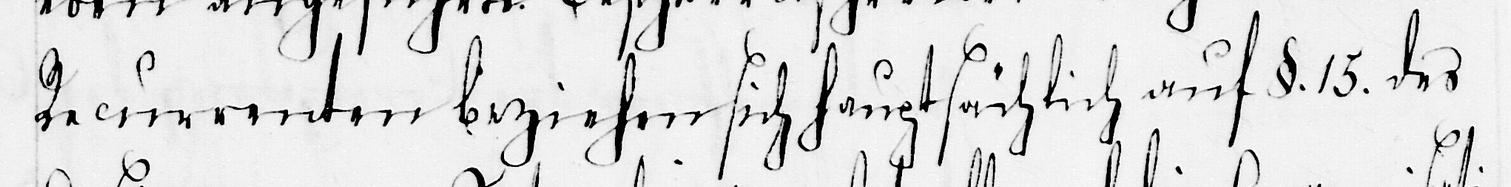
Recurrenten beziehen sich hauptsächlich auf §. 15. des
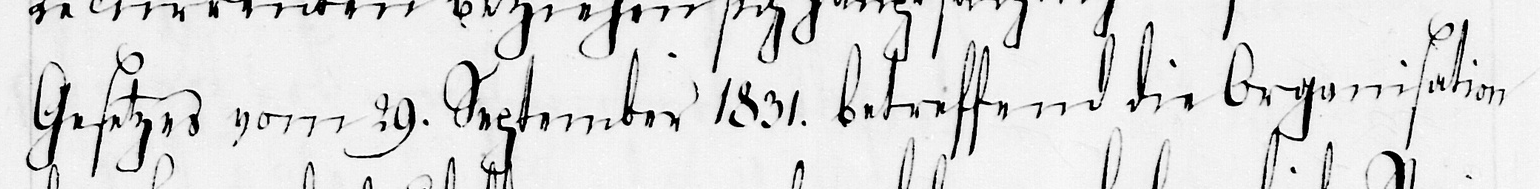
Gesetzes vom 29. September 1831. betreffend die Organisation
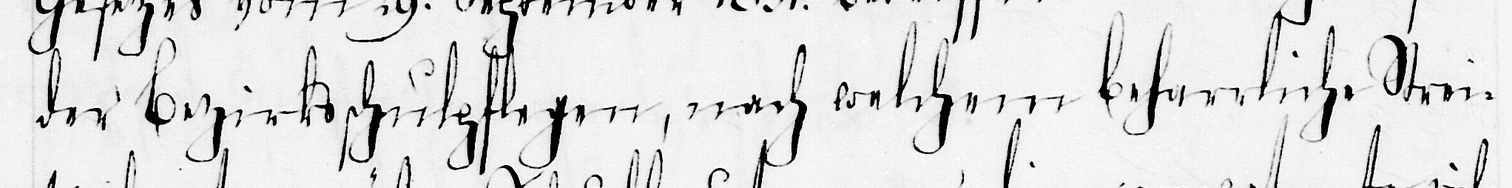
der Bezirksschulpflegen, nach welchem beharrliche Strei¬
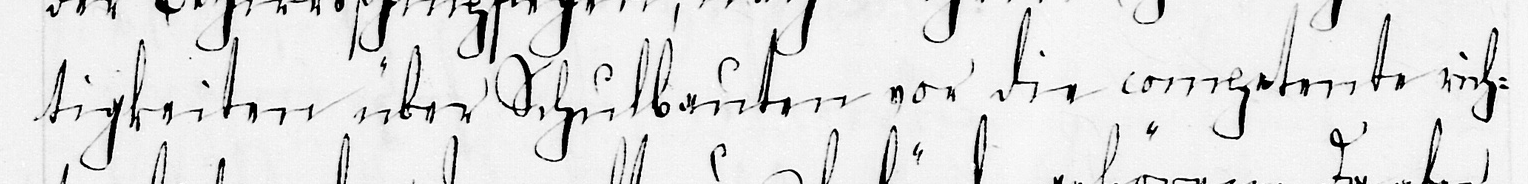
tigkeiten über Schulbauten vor die competente rich¬
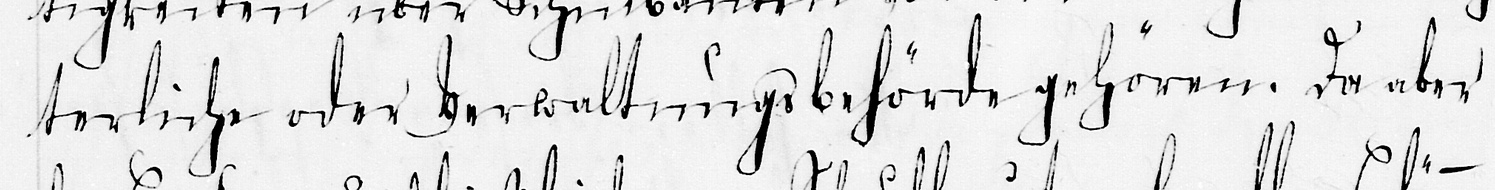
terliche oder Verwaltungsbehörde gehören. Da aber
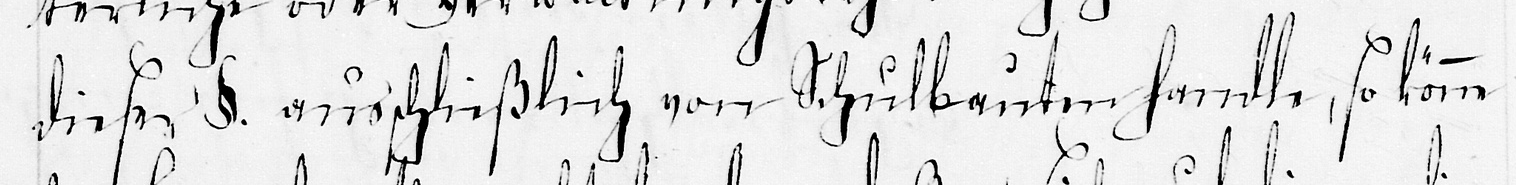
dieser §. ausschließlich von Schulbauten handle, so kön¬
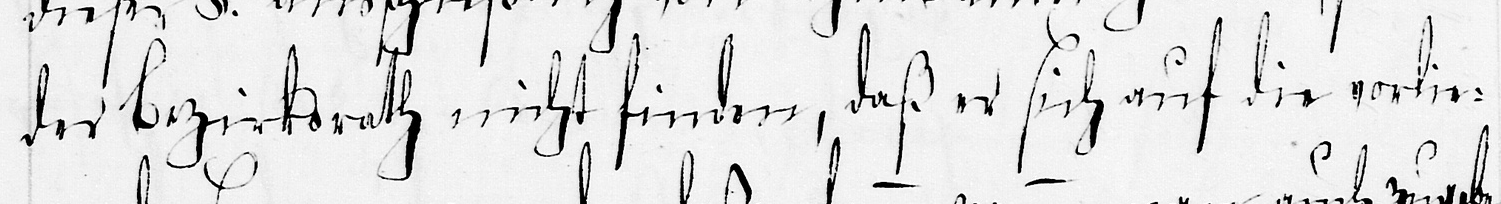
der Bezirksrath nicht finden, daß er sich auf die vorlie¬
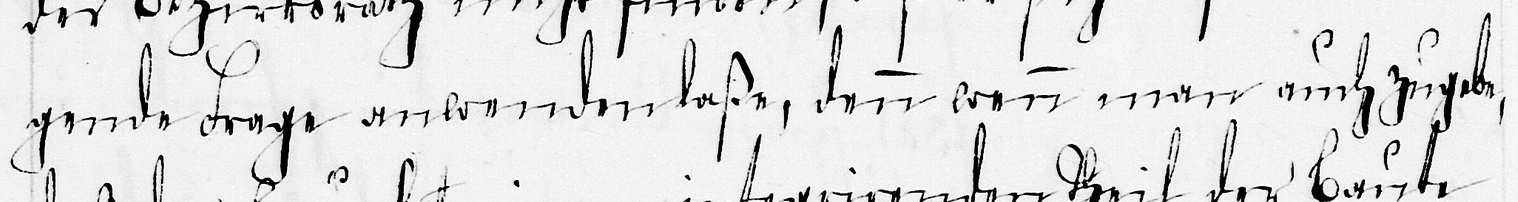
gende Frage anwenden laße, denn wenn man auch zugebe,
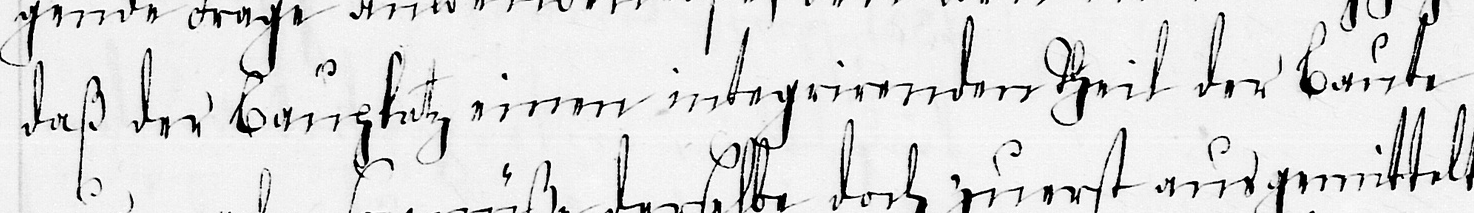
daß der Bauplatz einen integrirenden Theil der Baute
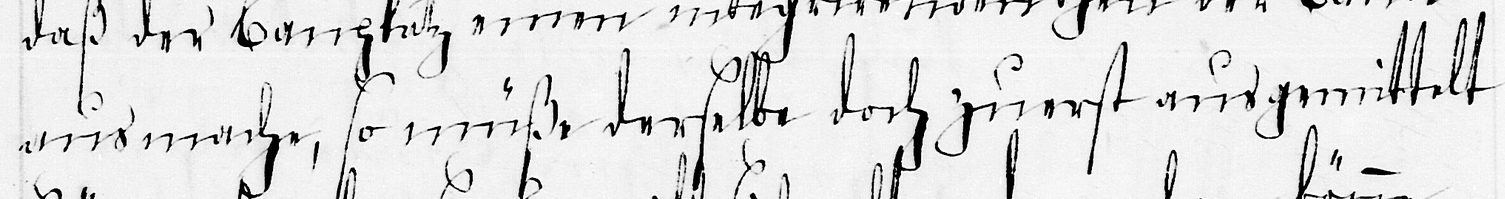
ausmache, so müße derselbe doch zuerst ausgemittelt
